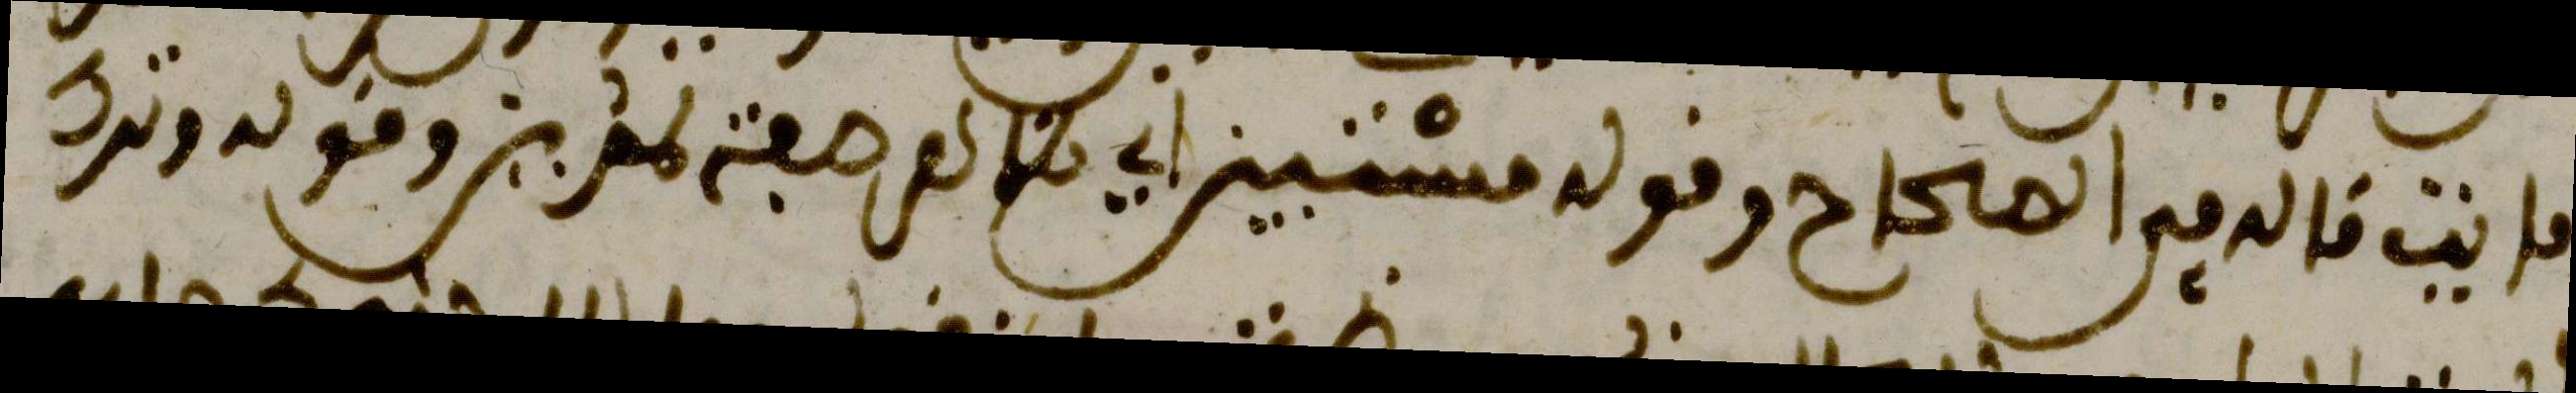مايت قاله في الصحاح وقوله مسْتبين اي ظاهر صفة لمدين وقوله وترك
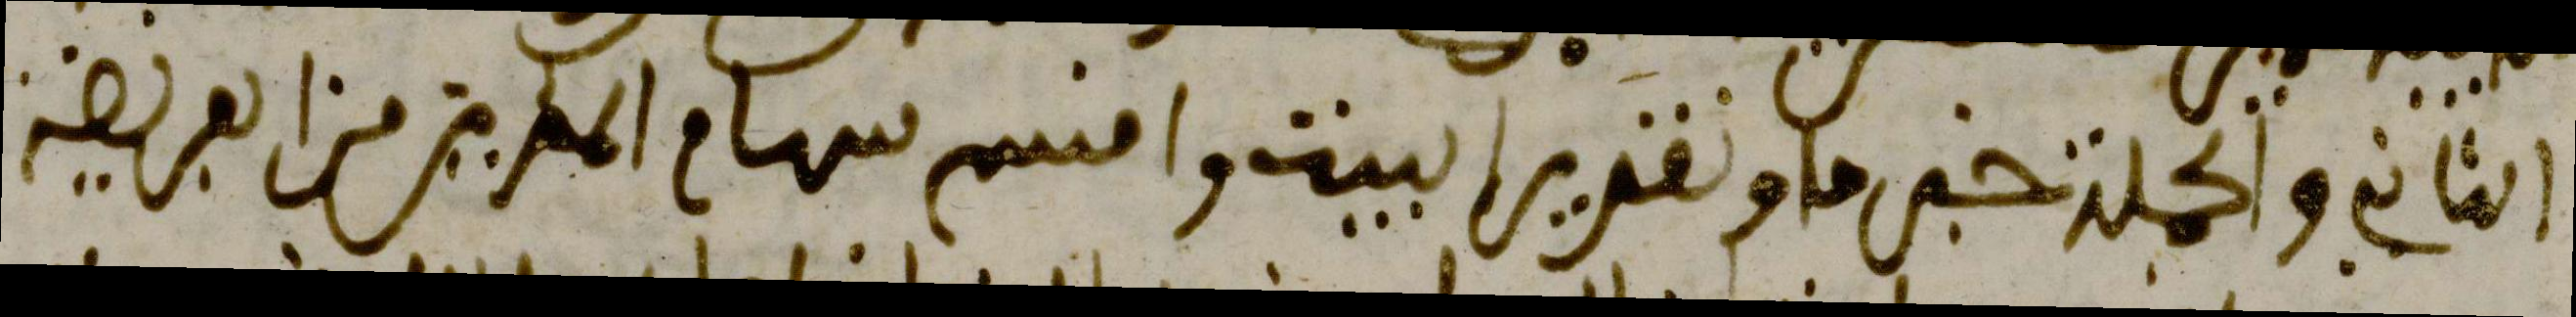الثاني والجملة خبر ما وتقدير البيت واقسم سهام المدين من الفريضة
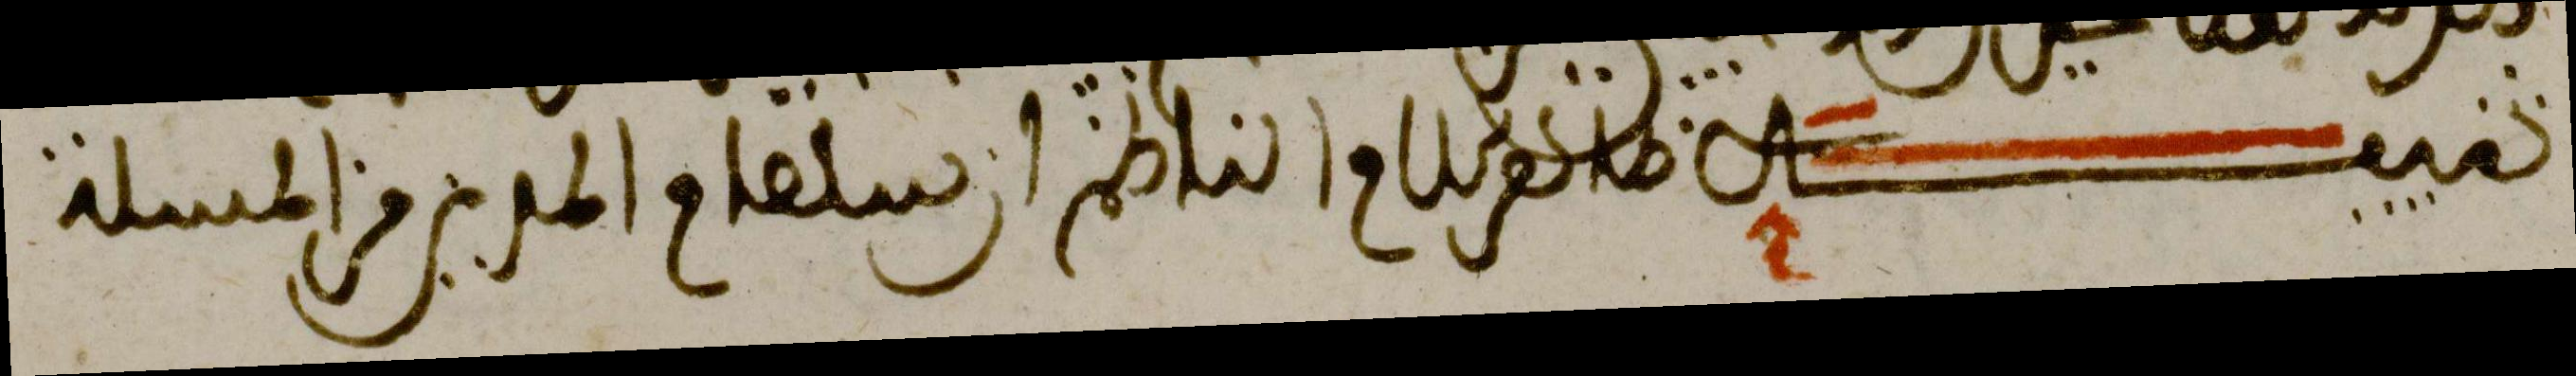تنبيه ظاهر كلام الناظم ان سهام المدين من المسلة
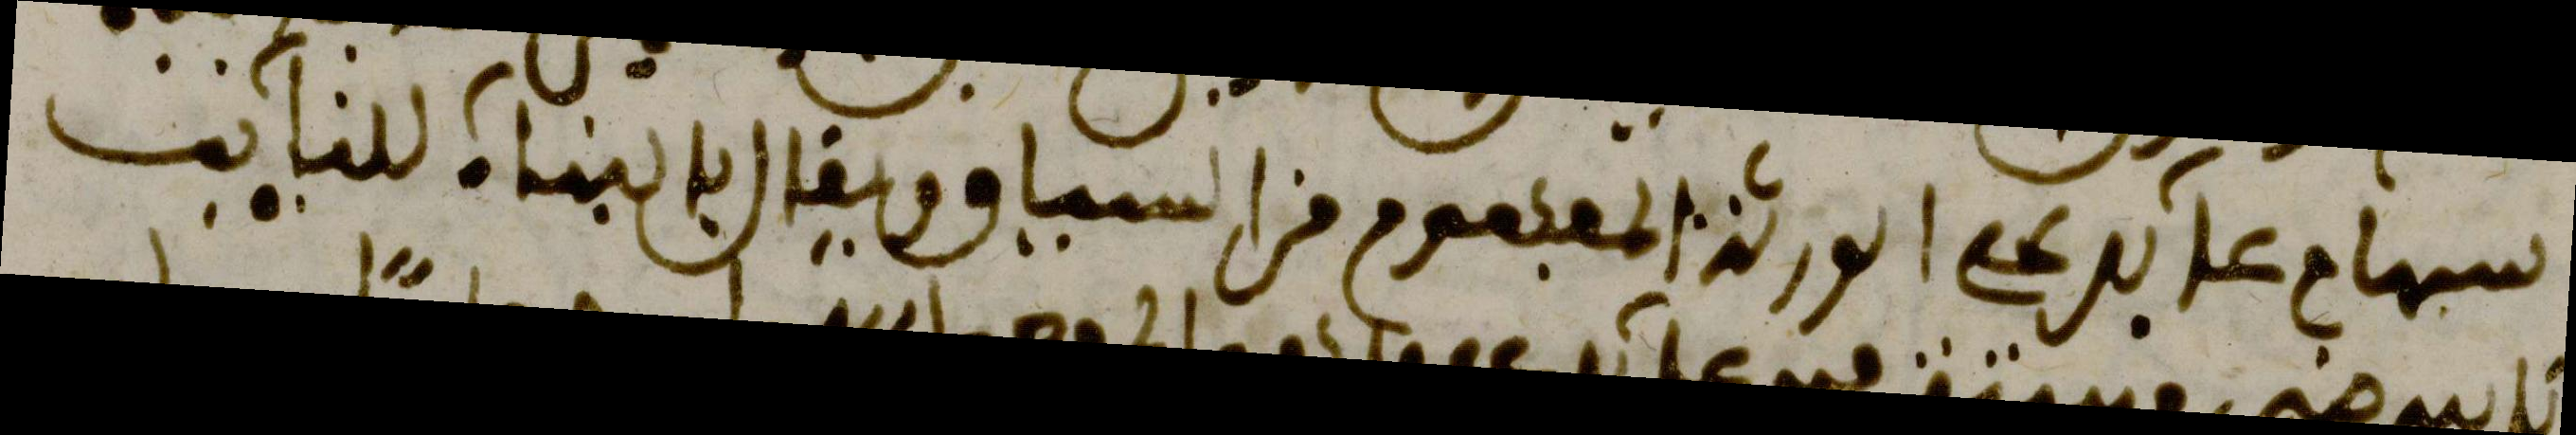سهام عائد على الورثة المفهوم من السياق ويقال بالبناء للنائب
